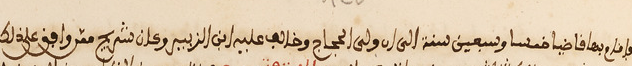فاقام بها قاضيا خمسا وسبعين سنة الى ان ولى الحجاج وخالف عليه ابن الزبير وكان شريح ممن وافق على ذلك
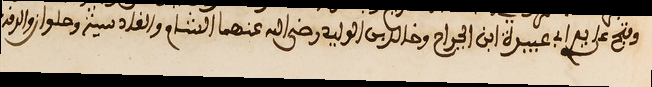وفتح على يدلي عبيدة ابن الجراح وخالد بن الوليد رضى الله عاهما الشام ولاقادسية وحلوان والرقة
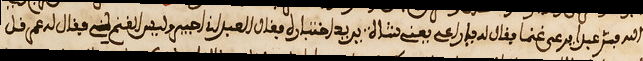الله فمر عبدا يرعى غنهما فقال له يا راعى يعنى شاة يريد اختباره فقال العبد انى اجير وليس الغنم لي فقال له عمر قل
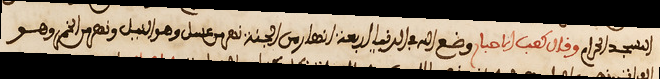المسجد الحرام وقال كعب الاحبار وضع الله في الدنيا أربعة انهار من الجنة نهر من عسل وهو النيل ونهر من الخمر وهو
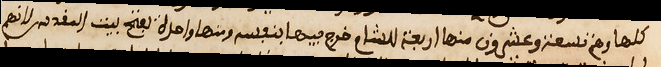كلها وهم تسعة وعشرون منها اربعة للشام خرج فيها بنفسه ومنها واحدة بفتح بيت المقدس لانهم
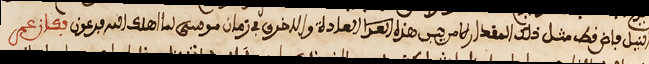النيل فاض قط مثل ذلك المقدار الا مرتين هذه العدا العادة والاخرى في زمان موسى لما اهلك الله فرعون
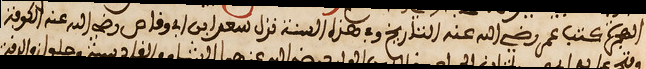الهجرة كتب عمر رضي الله عنه التاريخ وفي هذه السنة نزل سعد ابن ابى وقاص رضي الله عنه الكوفة
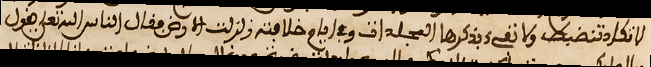لا تكاد تنضبط ولا تفىء بذكرها المجلدات وفي ايام خلافته ولزلت الارض فقال الناس الله تعلى يقول
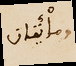ومائتان
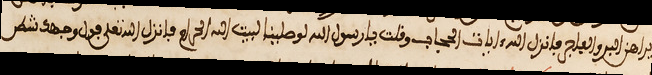يراهن البر والفاجر فانزل الله ءايات الحجاب وقلت يا رسول الله لو صلينا لبيت الله الحرام فانزل الله تعلى فول وجهك شطر
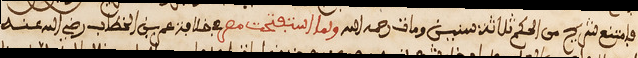فامتنع شريح من الحكم ثلاثة سنين ومات رحمه الله ولما استفتحت مصر في خلافة عمر بن الخطاب رضي الله عنه
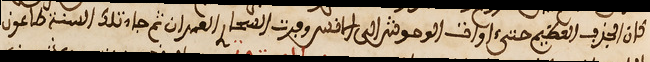كان الجزف العظيم حتى ءاوات الوحوش الى الانس وفرت السحارى العمران ثم جاء تلك السنة طاعون
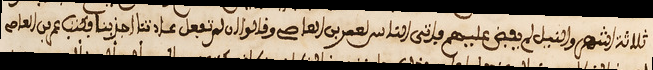ثلاثة اشهر والنيل لم يفض عليهم فاتى الناس لعمر بن العاص وقالوا ان لم تفعل عادتنا اخذ بنا فكتب عمر بن العاص
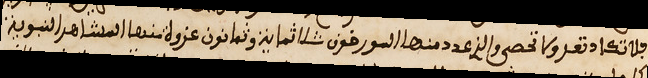فلا تكاد تعد ولا تحصى والذي عدد منها المورخون ثلاثماية وثمانون عزوة منها المشاهد النبوية
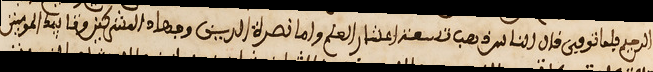الرحيم فلما توفى قال الناس ذهب تسعة اعشار العلم واما نصرة الدين وجهاد المشركين وتاييد المومنين
